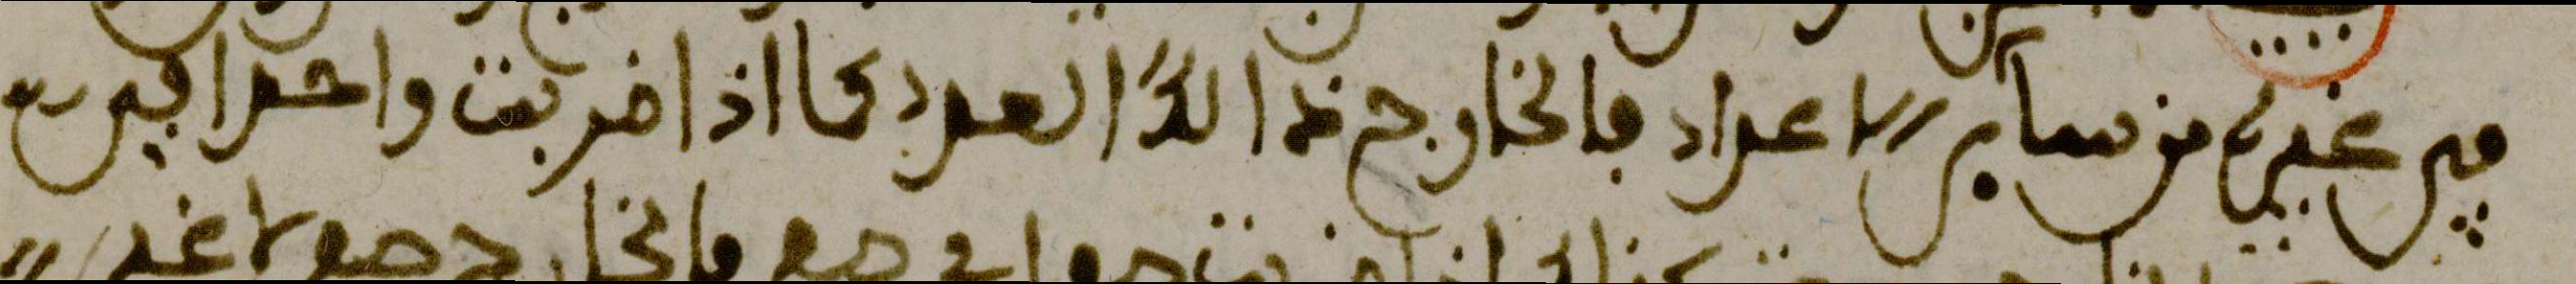في غيره من سائر الاعداد فالخارج ذالك العدد كما اذا ضربت واحدا في
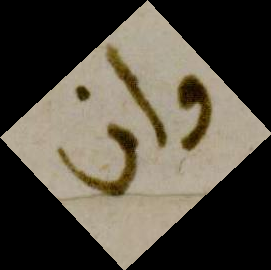و ان
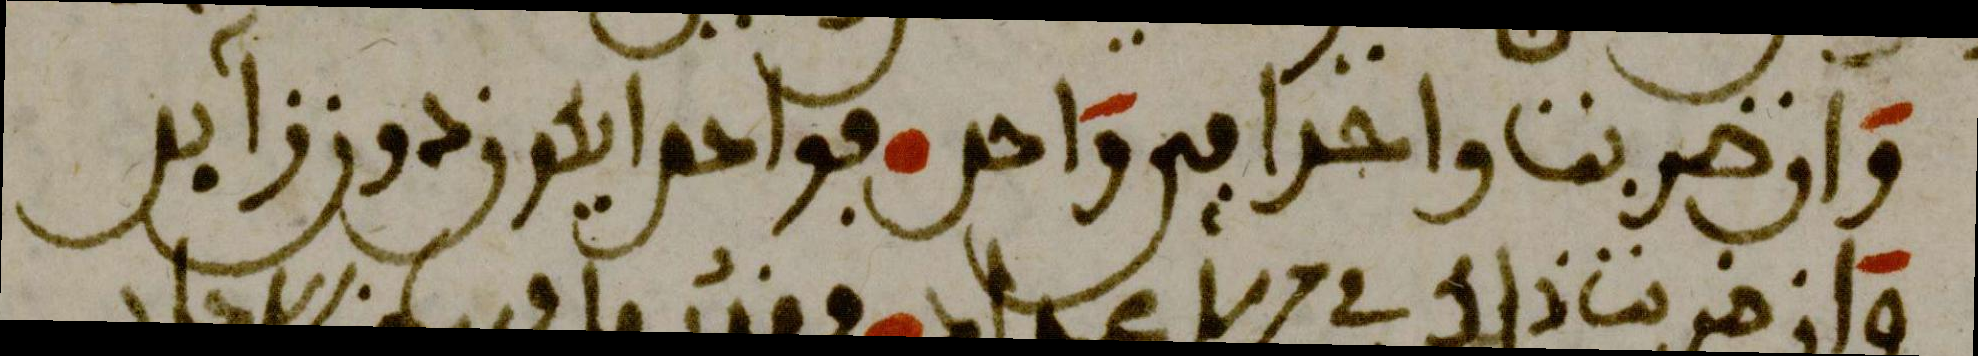و ان ضربت واحدا في واحد فواحدا يكون دون زائد
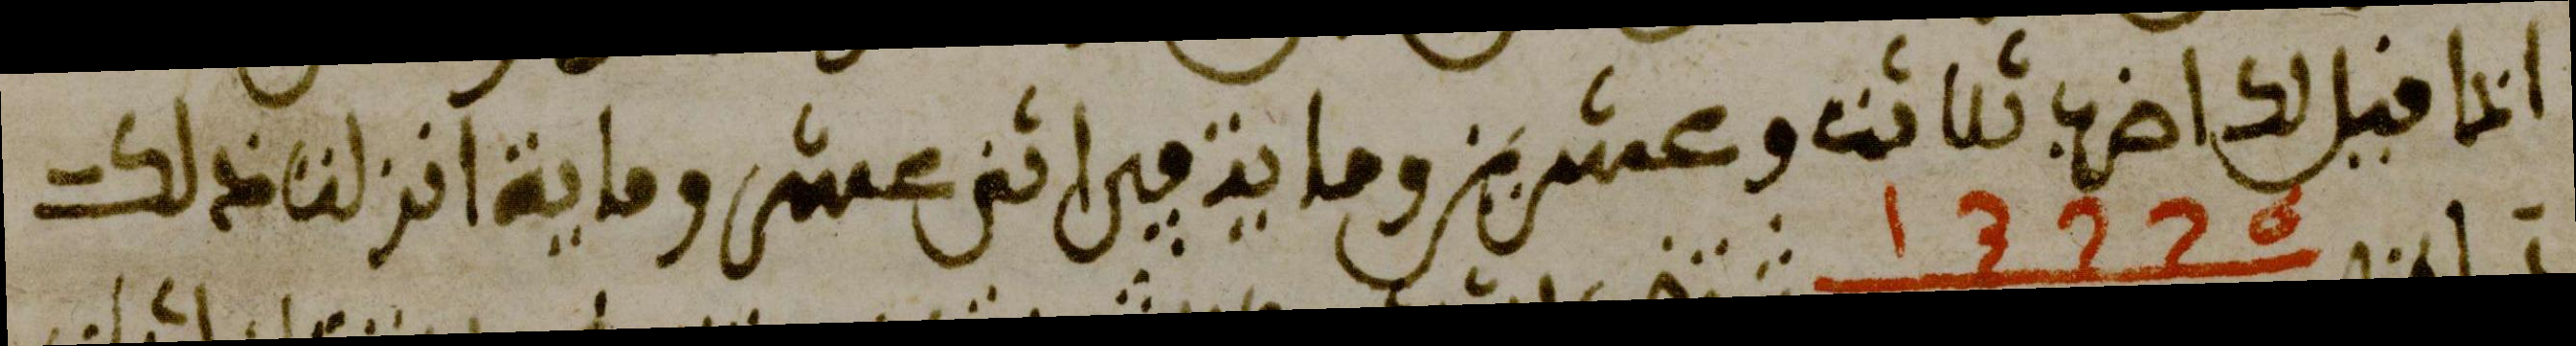اذا قيل لك اضرب ثلاثة و عشرين و ماية في اثنى عشر و ماية انزلت ذلك
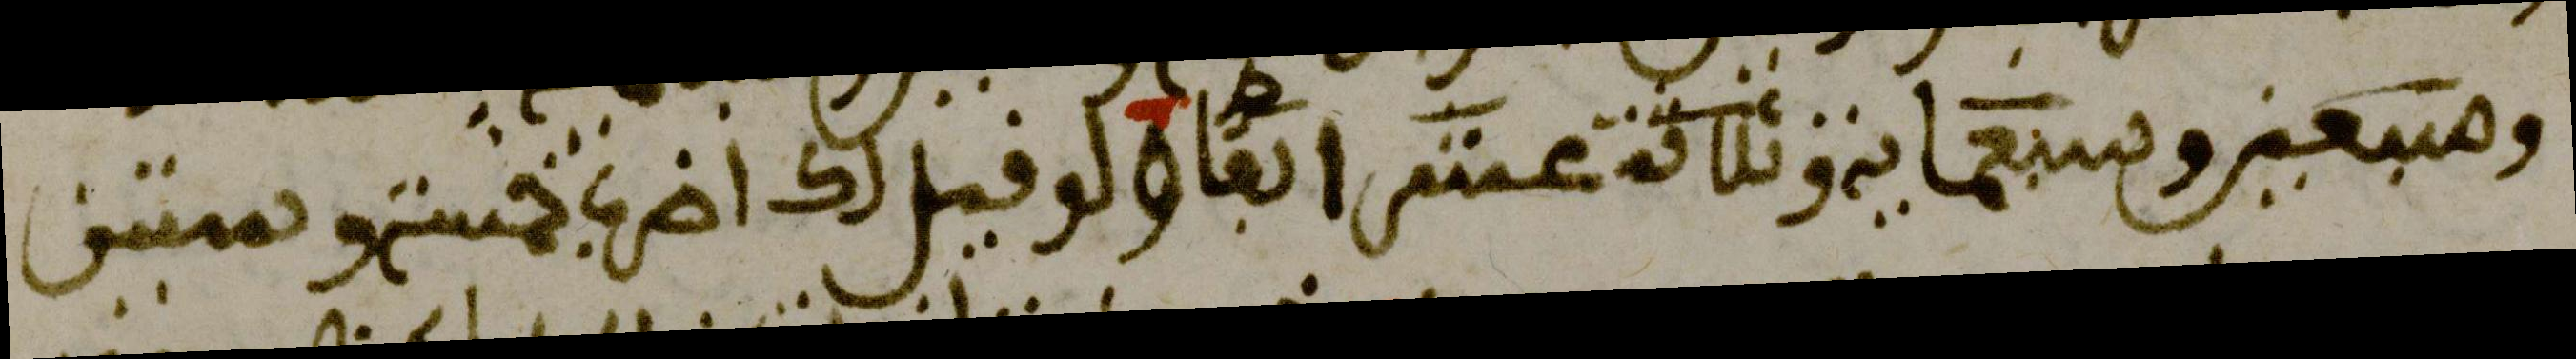و سبعين و سبعماية و ثلاثة عشر الفا و لو قيل لك اضرب خمسة و ستين
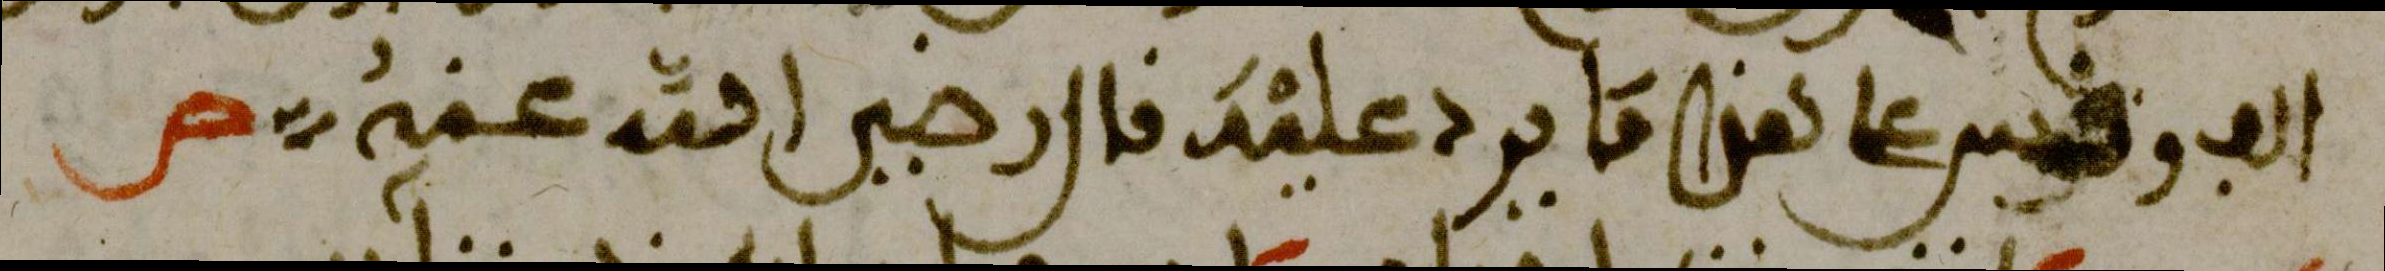الف و قس على هذا ما يرد عليك قال رضي الله عنه ص
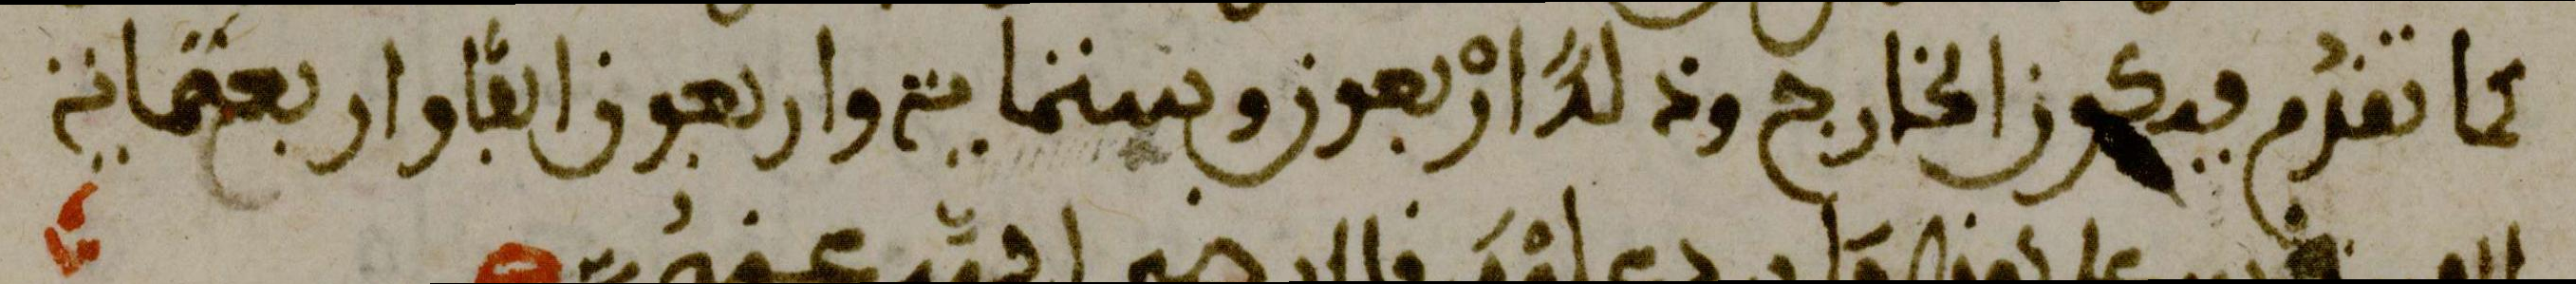كما تقدم فيكون الخارج و ذلك اربعون و ستماية و اربعون الفا و اربعتماية
